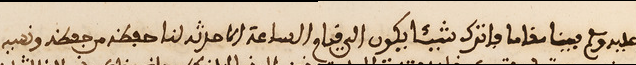عليه وسلم فينا مناما فاترك شيئا يكون الى قيام الساعة الاحدثه لنا حفظه من حفظه ونسيه
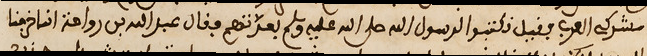مشركى العرب فقيل نكتبو الرسول الله صلى الله عليه وسلم بعدتهم فقال عبد الله بن رواحة انما خرجنا
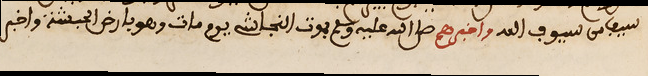سيف من سيوف الله واخبرهم صلى الله عليه وسلم بموت النخاشى يوم مات وهو بارض الحبشة واخبر
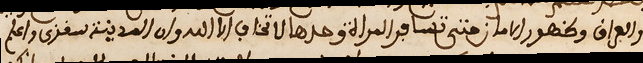والعراق وظهور الامان حتى تسافر المراة وحدها لا تخاف الا الله وان المدينة سغزى واعلم
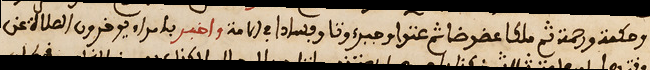وحكمة ورحمة ثم ملكا عضرضا ثم عتوا وجبرءوتا وفسادا في الامة واخبر بامراء يوخرون الصلاة عن
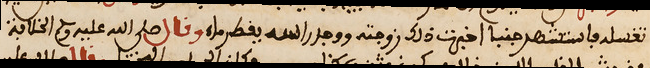تغسله فاستشهد جنبا اخبرت ذلك زوجته ووجد راسه يقطر ماء وقال صلى الله عليه وسلم الخلافة
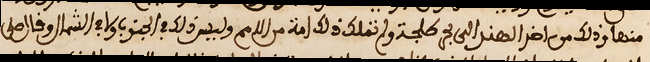منها وذلك من اضر الهند الى بحر طلجة ولم تملك ذلك امة من الامم وليس ذلك في الجنوب ولا في الشمال وقال صلى
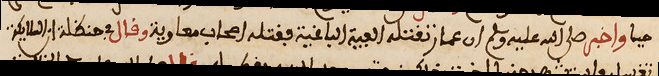حيا واخبر صلى الله عليه وسلم ان عمار تقتله الفية الباغية فقتله اصحاب معاوية وقال في حنظلة ان الملايكة
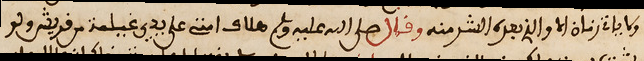ولاياتى زمان الا والذي بعده الشر منه وقال صلى الله عليه وسلم هلاك امتى على يدي عيلمة من قريش ولو
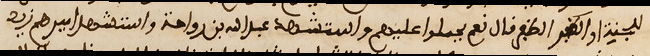للجنة او الظبر الظفر قال نعم يحملوا عليهم واستشهد عبد الله بن رواحة واستشهد اميرهم زيد
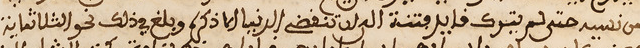من نسيه حتى لم يترك قاير فتنة الى لن تنقضى الدنيا الاذكره وبلغ في ذلك نحو الثلاثماية
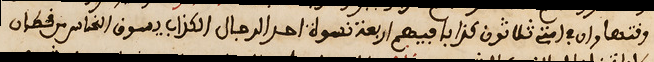ونتها وان في امتى ثلاثون كذابا فيهم اربعة نسوة احد الرجال الكذاب يسوق النحاس من ##طان
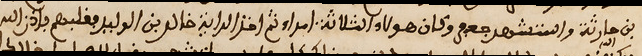بن حارثة واستشهد جعفر وكان هولاء الثلاثة امراء ثم اخذ الراية خالد بن الوليد فقلبهم باذن الله
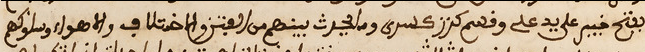بفتح خير على وقسم كزز كسرى وما يحدث بينهم من الفتن والاخد تلاف والاهواء وسلوكهم
